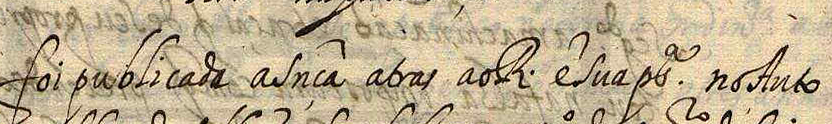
foi publicada a snçā atras ao R. ē sua psa. no Auto
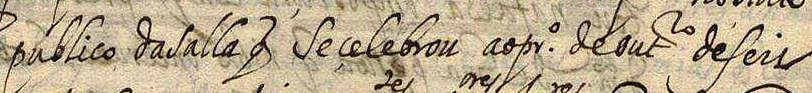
publico da salla q̄ Se celebrou ao pr.o de outro de seis
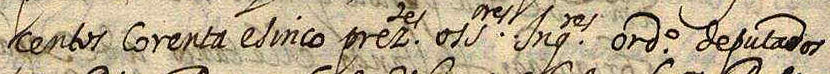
centos corenta e sinco prez.tes os sores. Inqres. ord.o deputados
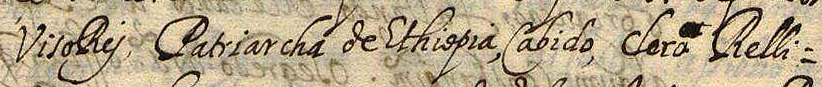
Viso Rej Patriarcha de Ethiopia, Cabido, clero Relli
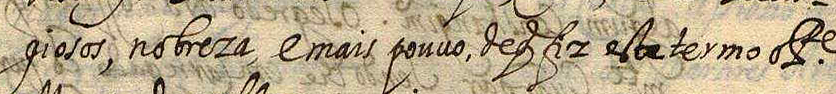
giosos, nobreza, e mais pouuo, de q̄ fiz este termo o P.e
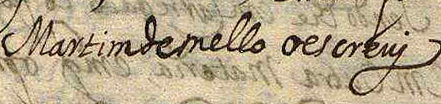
Martim de mello o escreuj
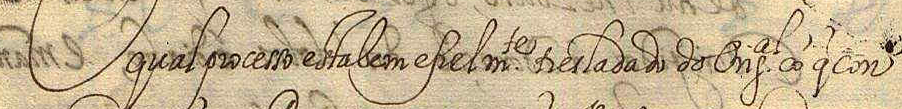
O qual processo esta bem e fielm.te tresladado do Orig.al cō q̄ con
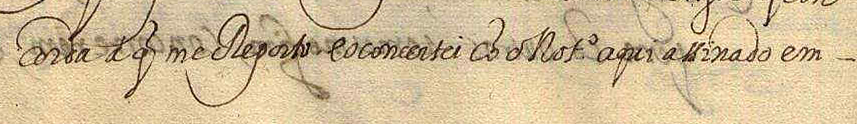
corda a q̄ me Reporto e o concertei cō o Not.o aqui assinado em -
